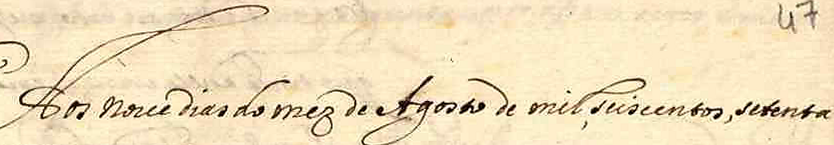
Aos noue dias do mez de Agosto de mil seiscentos, setenta
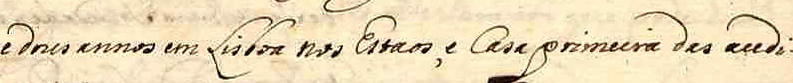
e dous annos em Lisboa nos Estaos, e Casa primeira das audi
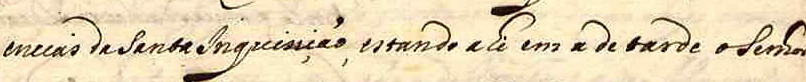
encias da Santa Jnquisição, estando ahi em a de tarde o Senhor
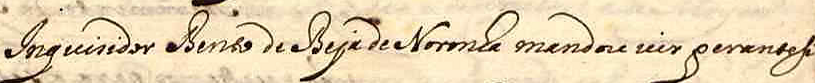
Jnquisidor Bento de Beja de Noronha mandou uir perante si
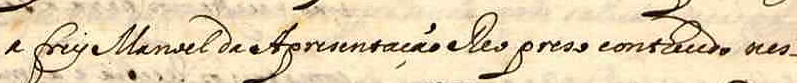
a frey Manoel da Apresentação Reo preso contheudo nes
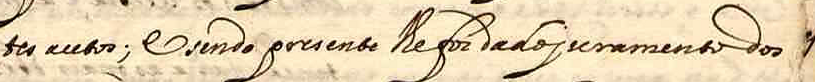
tes autos; E sendo presente lhe foi dado juramentos dos
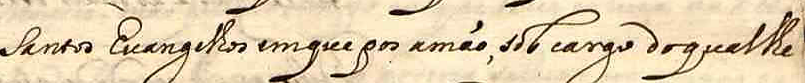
Santos Evangelhos em que pos a mão, sob cargo do qual lhe
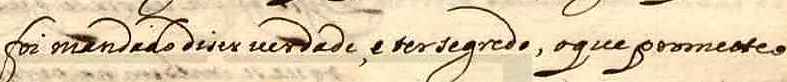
foi mandado diser verdade, e ter segredo, o que prometeo
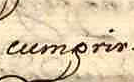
cumprir
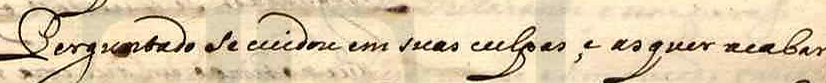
Perguntado se cuidou em suas culpas, e as quer acabar
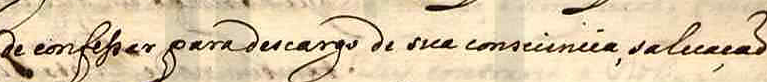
de confessar para descargo de sua consciencia, saluaçaõ
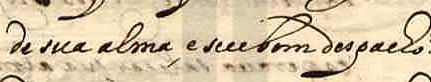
de sua alma, e seu bom despacho.
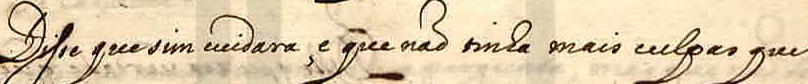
Disse que sim cuidara, e que não tinha mais culpas que
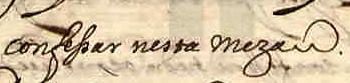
confessar nesta meza.
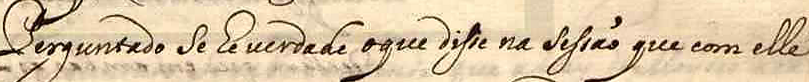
Perguntado se he verdade o que disse na sessão que com elle
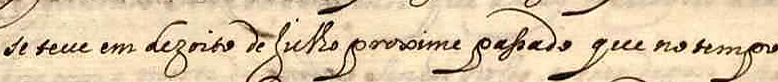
se teue em dezoito de Julho proximo passado que no tempo
